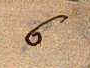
6
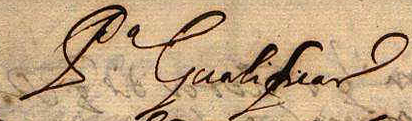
Pa Qualificar
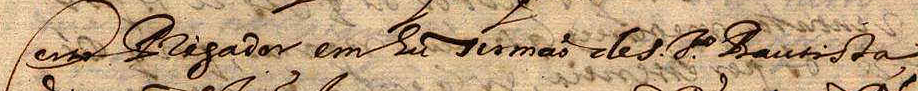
Certo Pregador em hū sermaõ de S. I.o Bautista
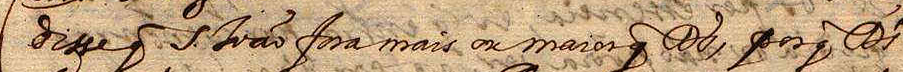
disse q̄ s. Ioaõ fora mais ou maior q̄ Ds̄, porq̄ Ds̄
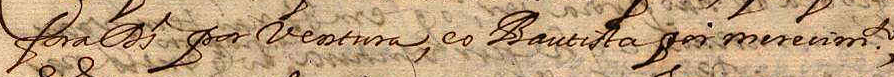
fora Ds̄ por ventura, e o Bautista por merecimto,
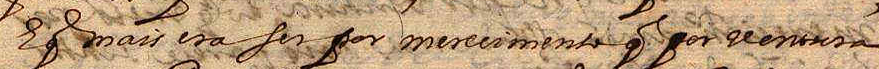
E q̄ mais era ser por merecimento q̄ por ventura
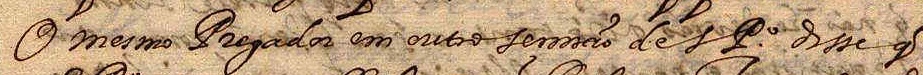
O mesmo Pregador em outro sermaõ de S P.o disse q̄
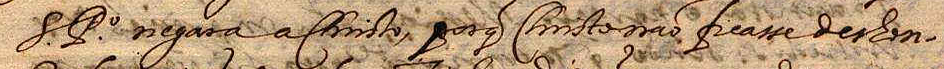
S. P.o negara a Christo, porq̄ Christo naõ ficasse deshon
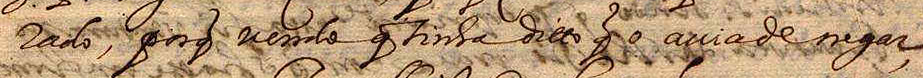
rado, porq̄ uendo q̄ tinha ditto q̄ o auia de negar,
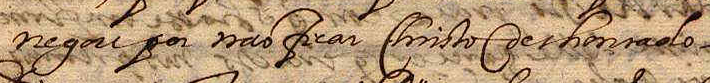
negou por naõ ficar Christo deshonrado
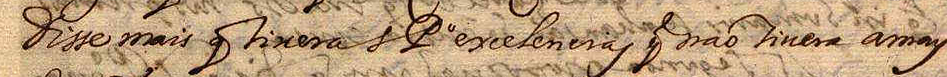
Disse mais q̄ tiuera S Po excelencias q̄ naõ tiuera a may
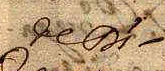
de Ds̄ -
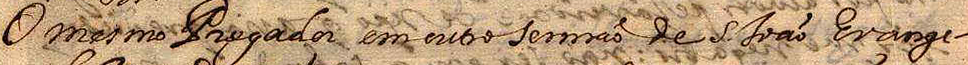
O mesmo Pregador em outro sermaõ de S. Ioaõ Evange
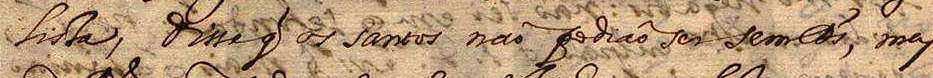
lista, disse q̄ os santos naõ podiaõ ser sem Ds̄, mas
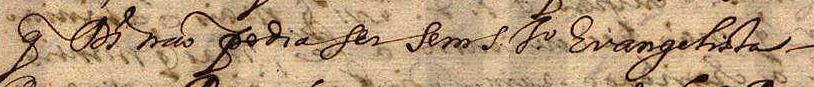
q̄ Ds̄ naõ podia ser sem s. I.o Evangelista -
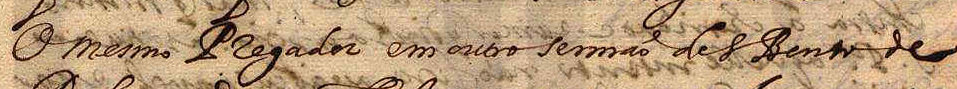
O mesmo Pregador em outro sermaõ de S Bento de
